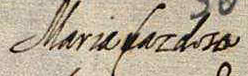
Maria Cardosa
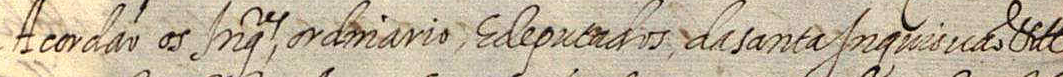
Acordaõ os Inqres, ordinario, E deputados, da santa Jnquisicaõ &tt
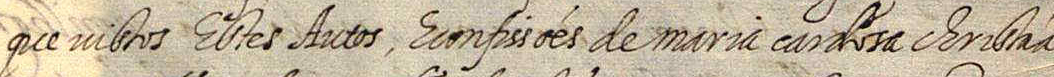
que uistos Estes Autos, E confissoẽs de maria cardosa christaā
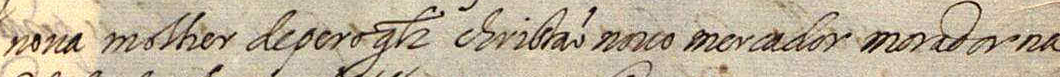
noua molher de pero gl̄z christaõ nouo mercador morador na
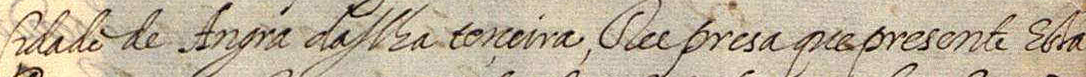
Cidade de Angra da Jlha terçeira, Ree presa que presente Esta
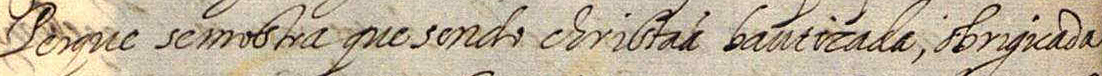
Porque se mostra que sendo christaā bautizada, obriguada
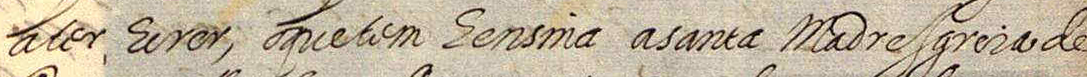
a ter, E crer, o que tem E ensina a santa Madre Jgreia de
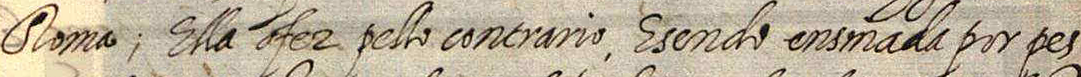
Roma; Ella o fez pello contrario, E sendo ensinada por pes
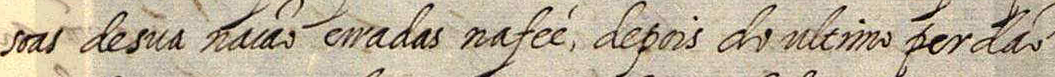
soas de sua nacaõ erradas na feé, depois do ultimo perdaõ
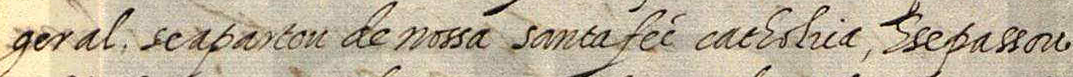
geral, se apartou de nossa santa feé catholica, E se passou
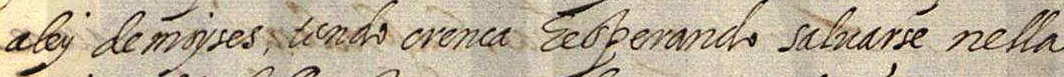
a ley de moyses, tendo crenca E esperando saluarse nella
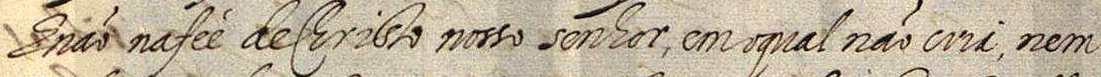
E naõ na feé de Christo nosso senhor, em o qual naõ cria, nem
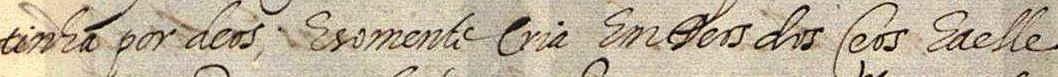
tinha por deos; E somente cria Em Deos dos Ceos E a elle
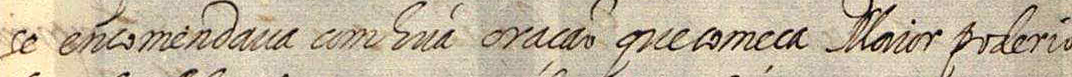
se encomendaua com huā oraçaõ que começa Maior poderio
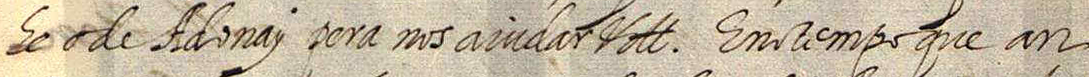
he o de Adonay pera nos aiudar &tt. E no tempo que an
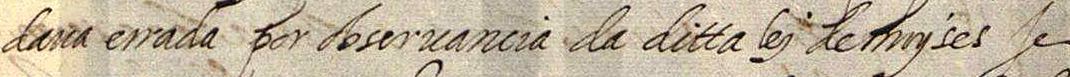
daua errada por obseruancia da ditta lej de moyses Je
